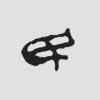民
